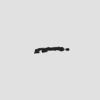一
